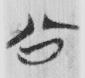公
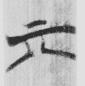亓
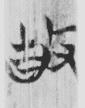故
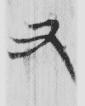又
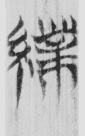{糸帶}
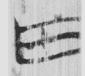甲
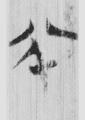{八千}
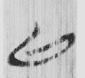㠯（以）
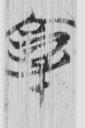{亯羊}
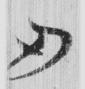刃
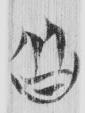皆
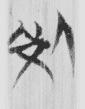死
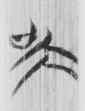吳
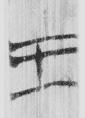王
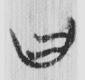曰
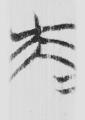夫=
